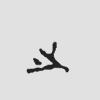出
